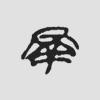群
